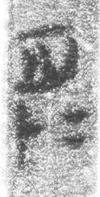四十
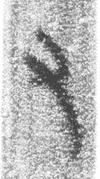又
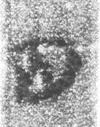四
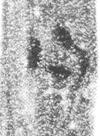少（小）
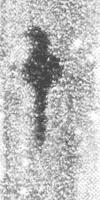十
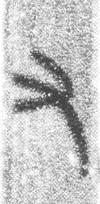又
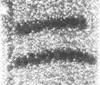二
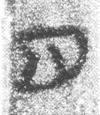四
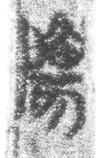糗
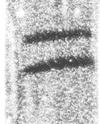二
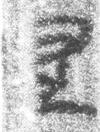豆
